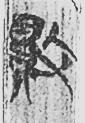敗
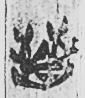晉
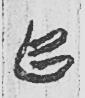𠂤
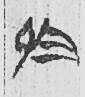於
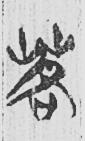茖
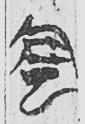侌
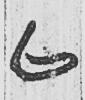㠯（以）
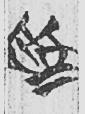爲
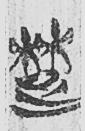楚
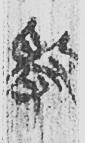{爰攴}
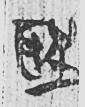聖
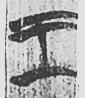王
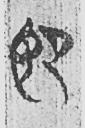即
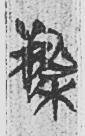殜
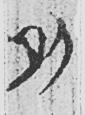{夕刀}
